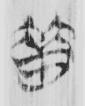昔
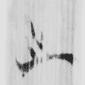之
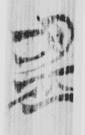盟
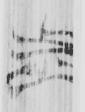者
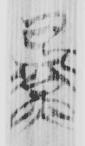{日棗}
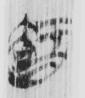智
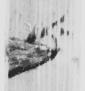此
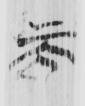而
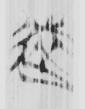遠
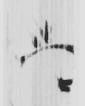之
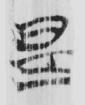是
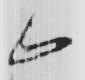㠯（以）
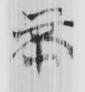不
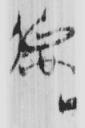{人㠯心}
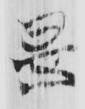是
